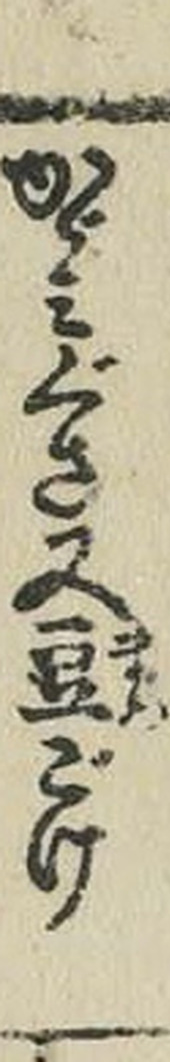かゞみぐさ又豆ごけ

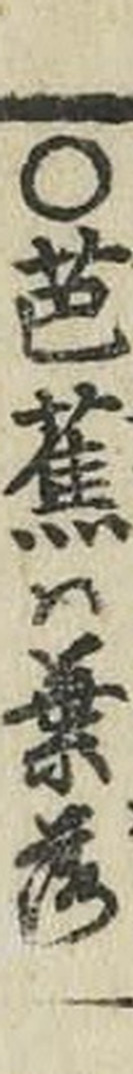○芭蕉は葉落
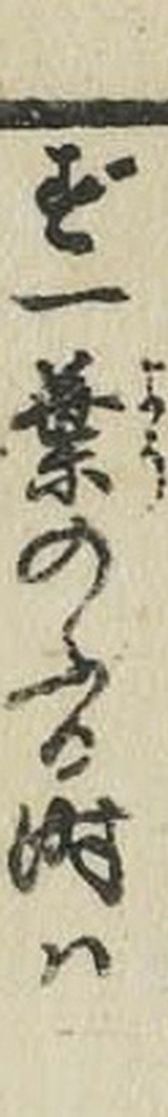ず一葉のふる時は
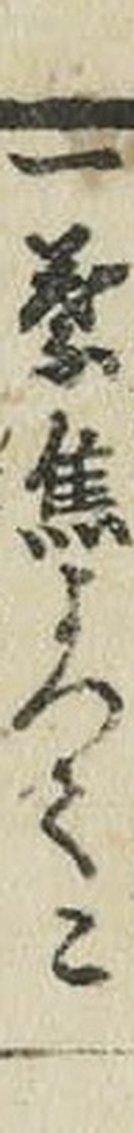一葉焦よつてこ
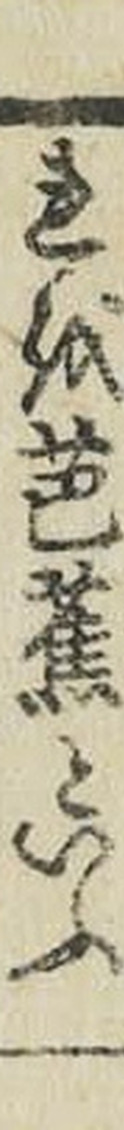れを芭蕉といふ
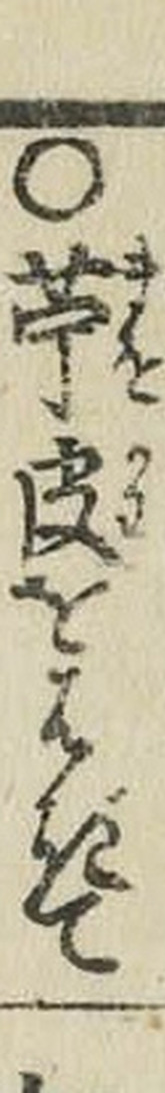○苧皮をはぎて
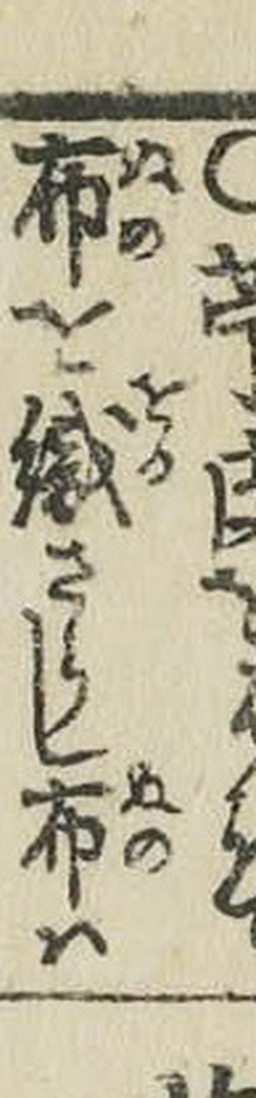布を織さらし布は
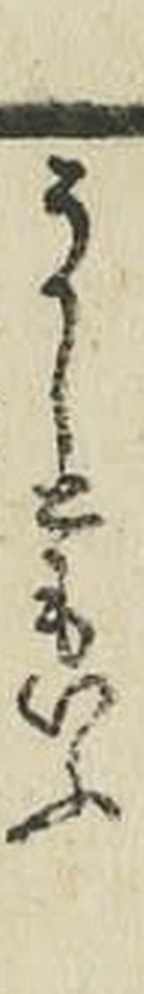うしともいふ
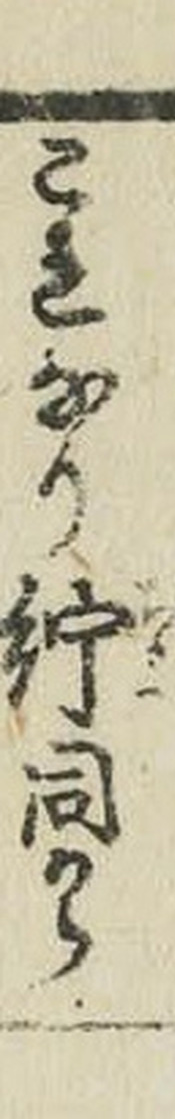これなり紵同から
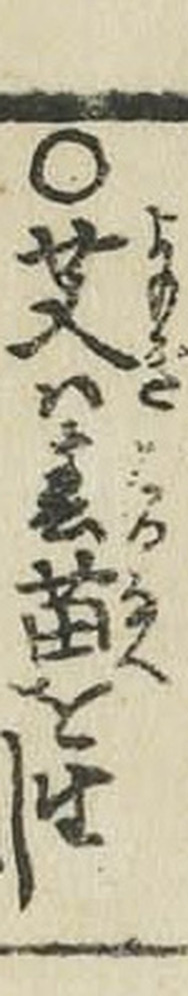○艾は春苗を生し
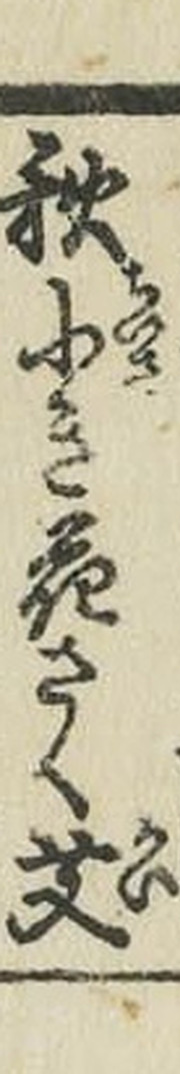秋小き花さく艾
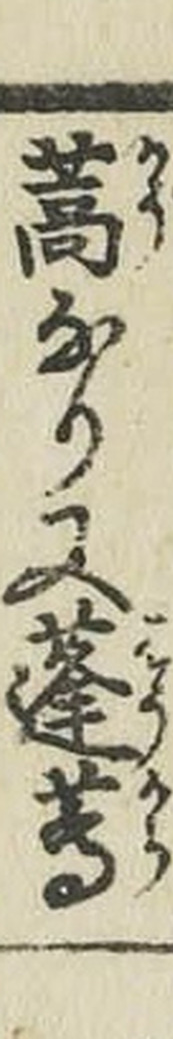蒿なり又蓬蒿
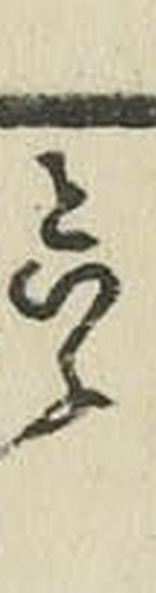といふ
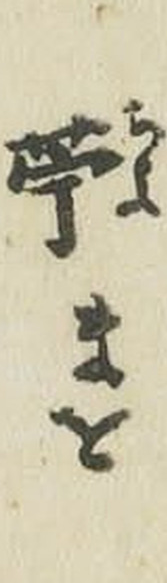苧まを
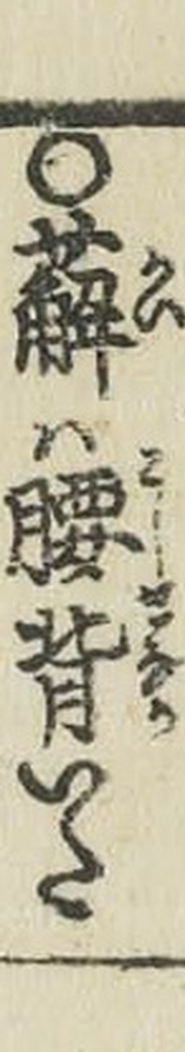○薢は腰背いた
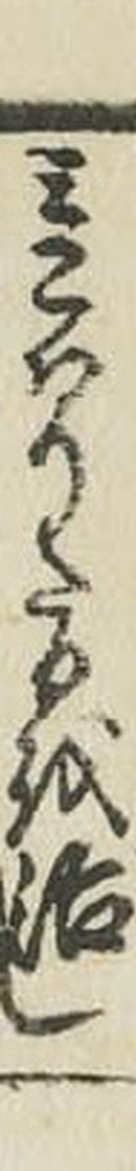みこはりたるを治し
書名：増補頭書訓蒙図彙大成 10巻 9:巻之20
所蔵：東京学芸大学教育コンテンツアーカイブ
